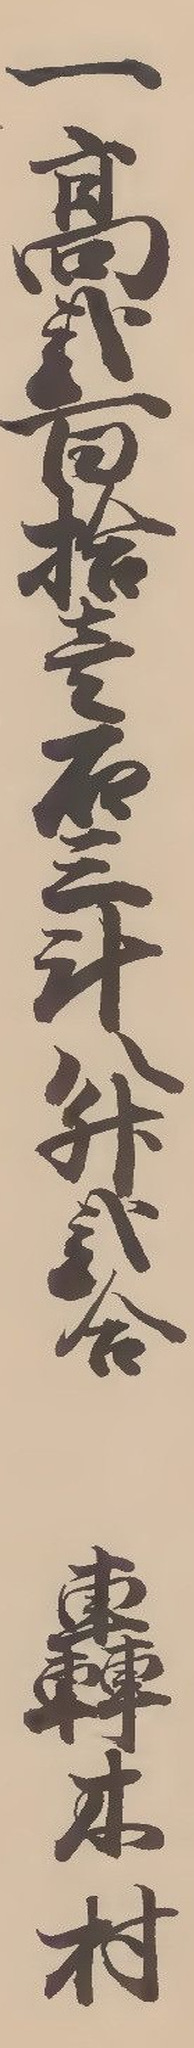一高弐百拾壱石三斗八升弐合轟木村
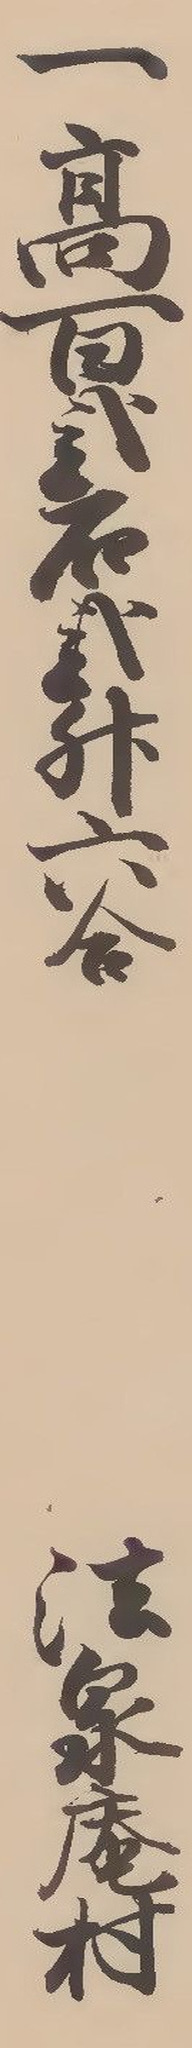一高百弐石弐升六合法泉庵村

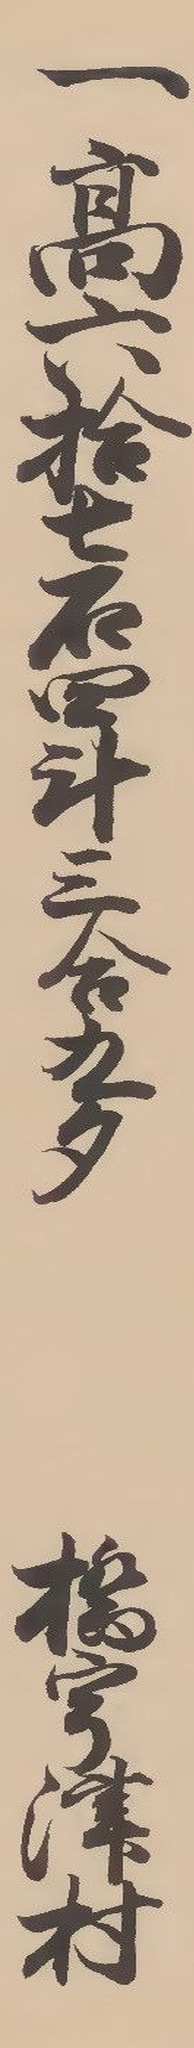一高六拾七石四斗三合九勺橋宇津村
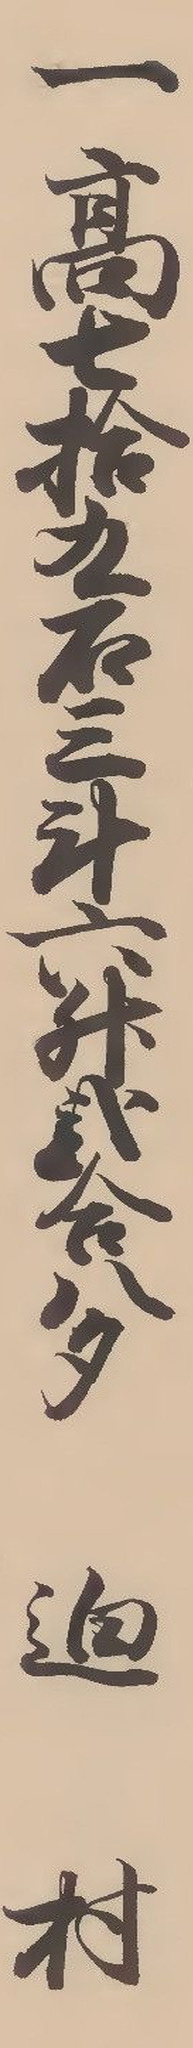一高七拾九石三斗六升弐合八勺迫村
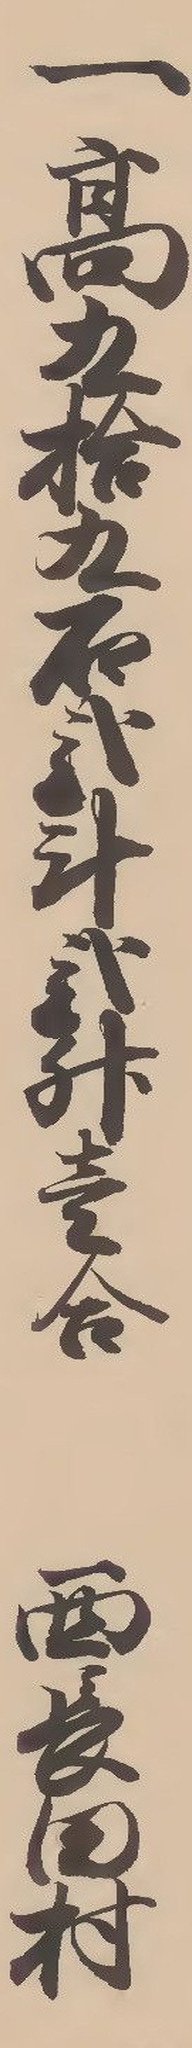一高九拾九石弐斗弐升壱合西長田村
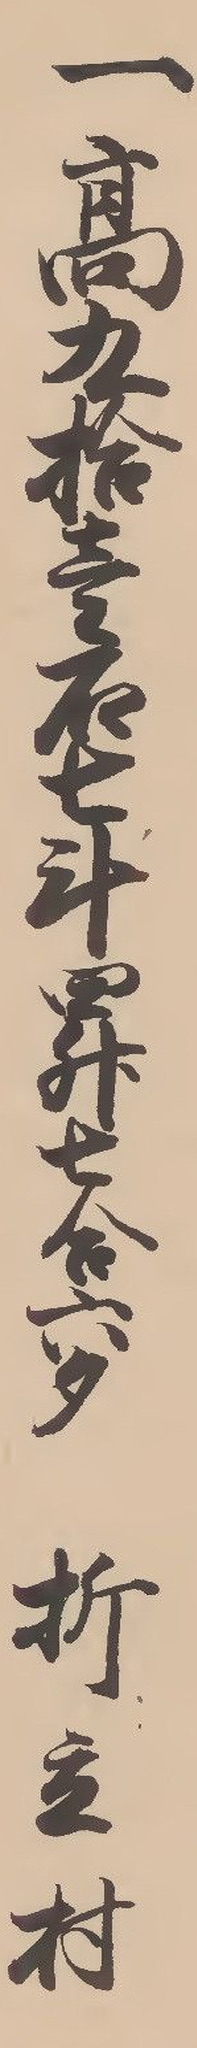一高九拾壱石七斗四升七合六勺折立村
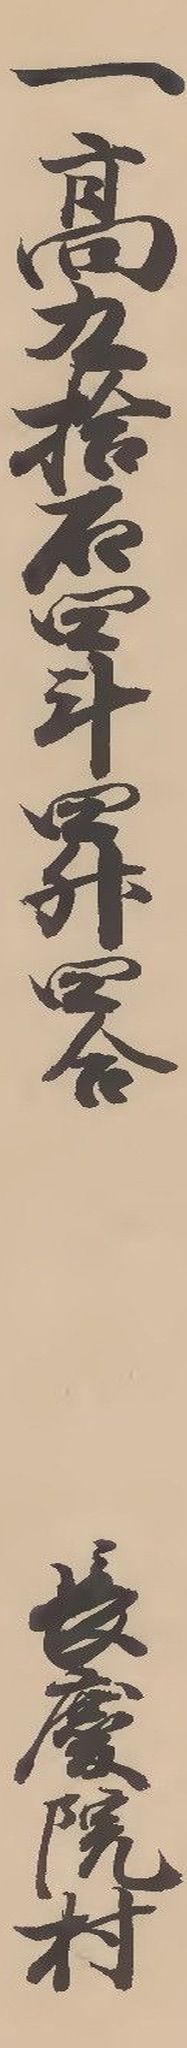一高九拾石四斗四升四合長慶院村
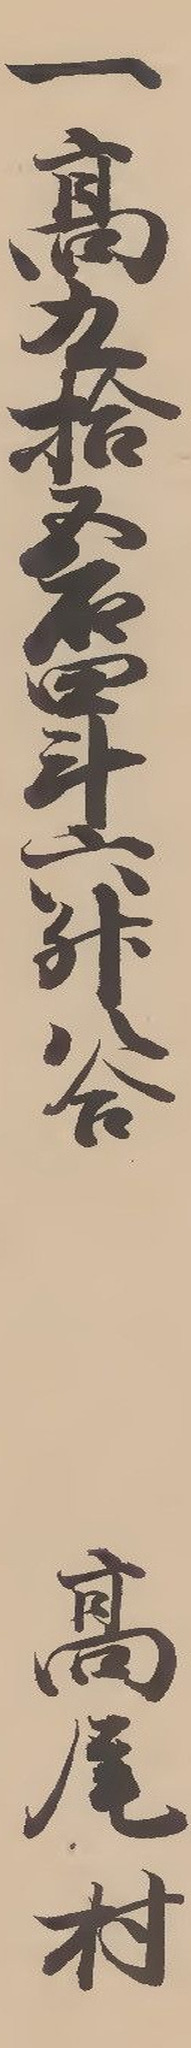一高九拾五石四斗六升八合高尾村
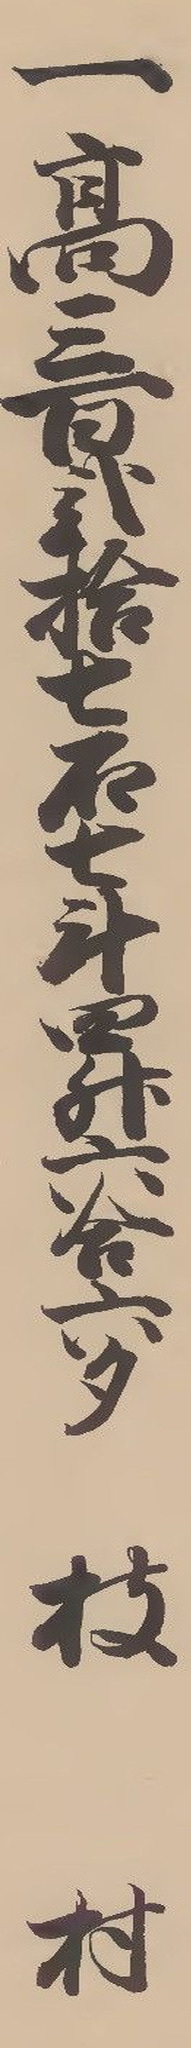一高三百弐拾七石七斗四升六合六勺枝村
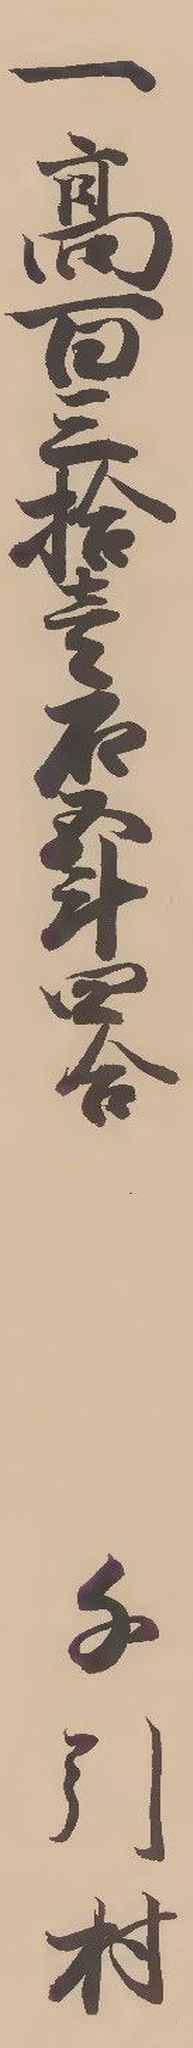一高百三拾壱石五斗四合千引村

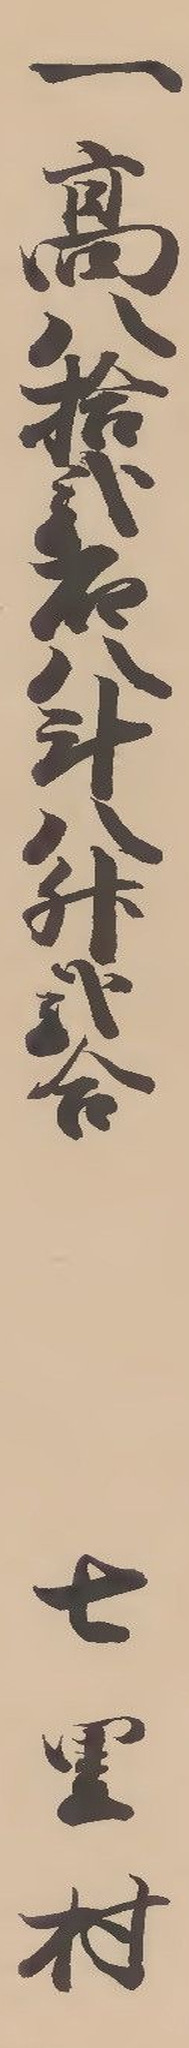一高八拾弐石八斗八升弐合七里村
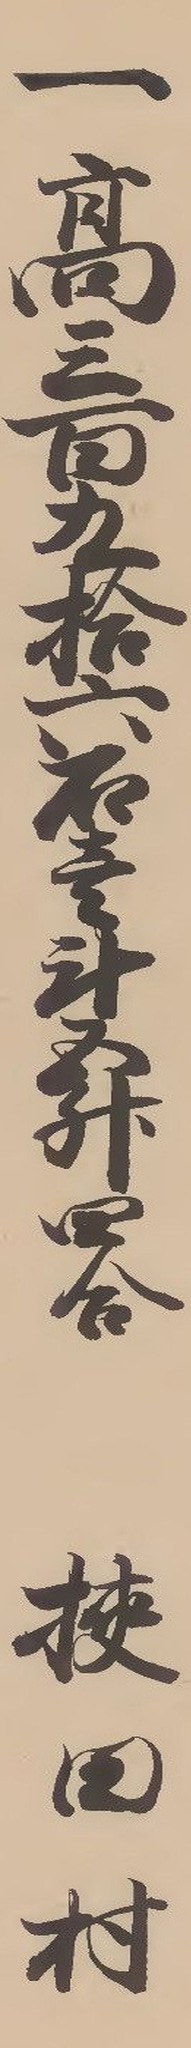一高三百九拾六石壱斗五升四合挟田村
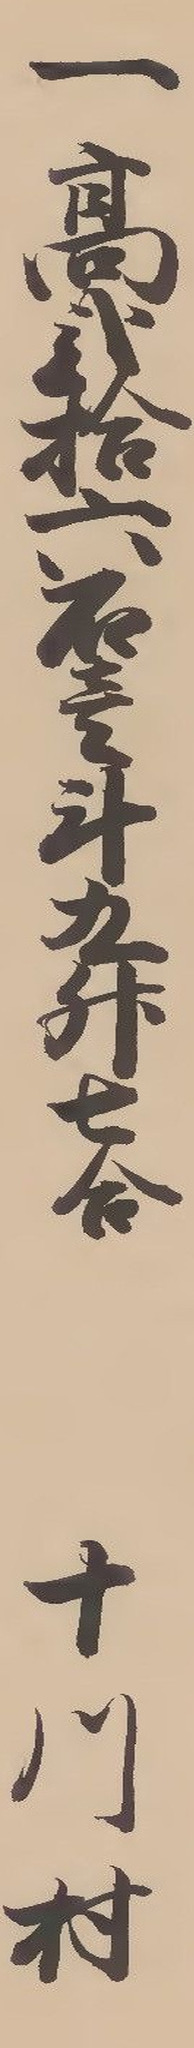一高弐拾六石壱斗九升七合十川村
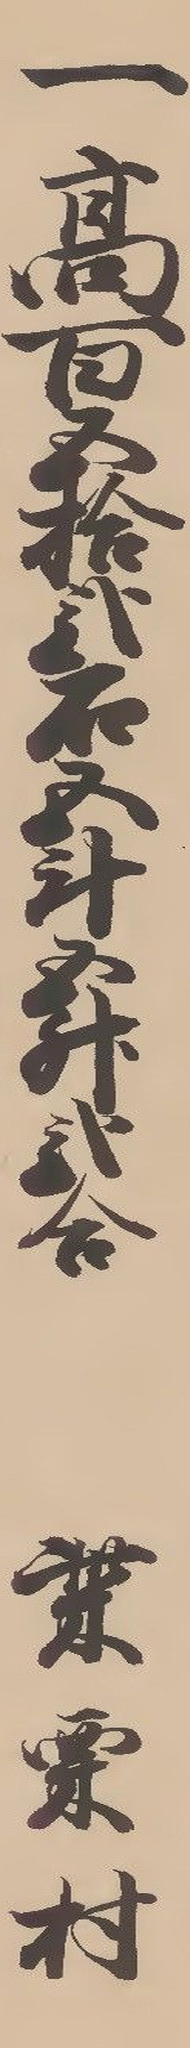一高百五拾弐石五斗五升弐合葉栗村
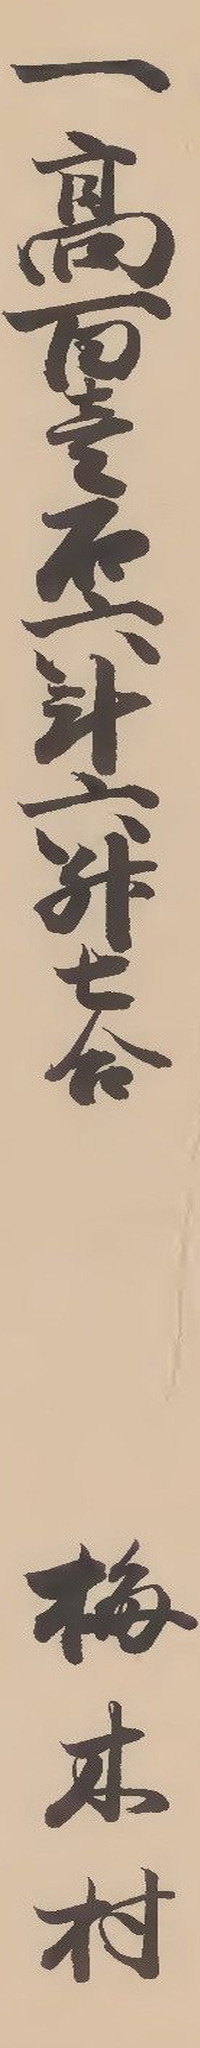一高百壱石六斗六升七合梅木村
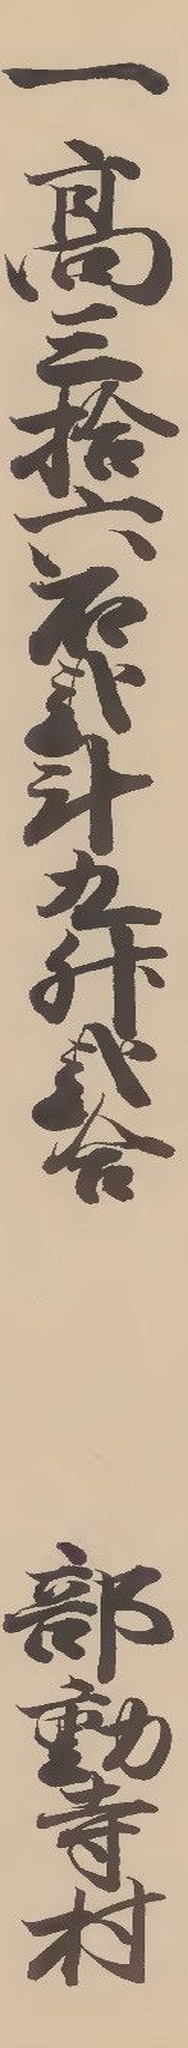一高三拾六石弐斗九升弐合部動寺村
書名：豊後国郷帳
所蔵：国立公文書館 National Archives of Japan
